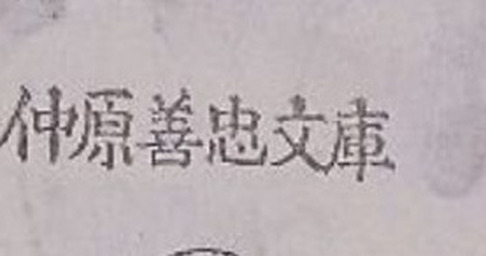仲原善忠文庫
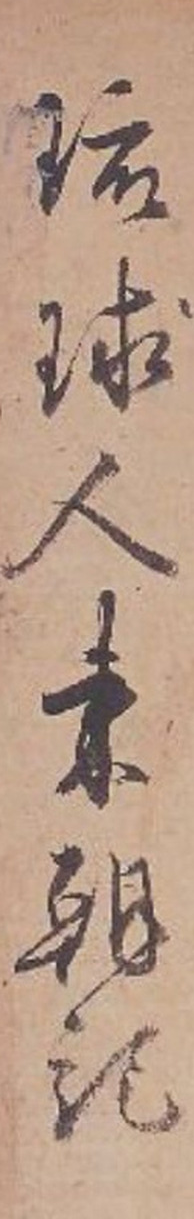琉球人来朝記

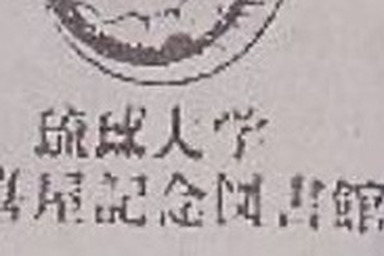琉球大学
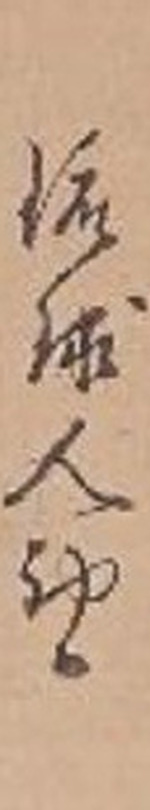琉球人初而
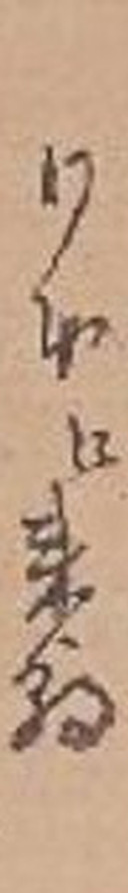日本え来朝
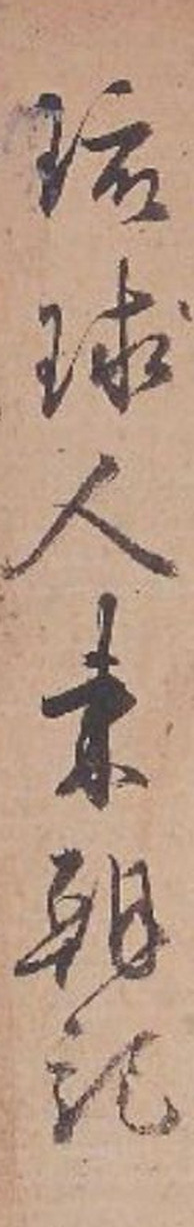琉球人来朝記

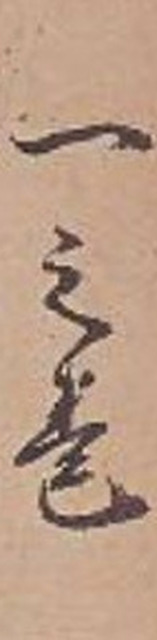一之巻
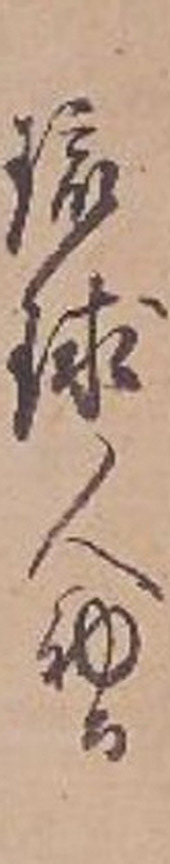琉球人初而
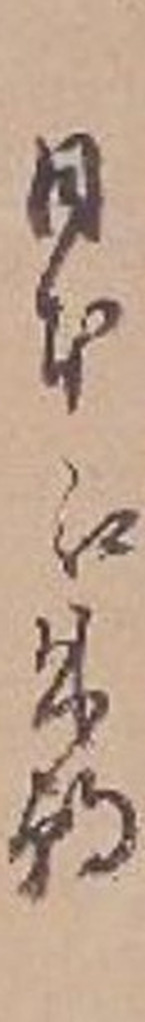日本江来朝
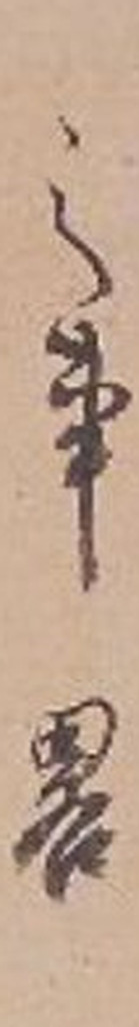之事略
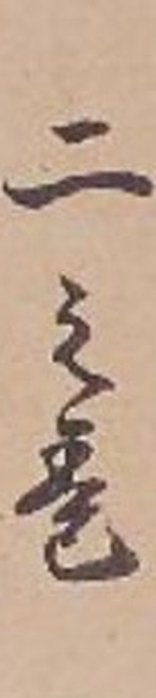一之巻
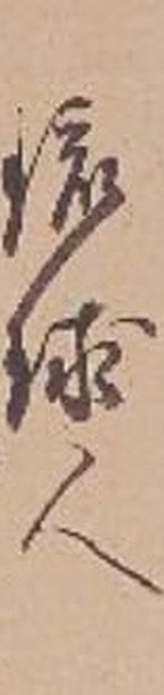琉球人
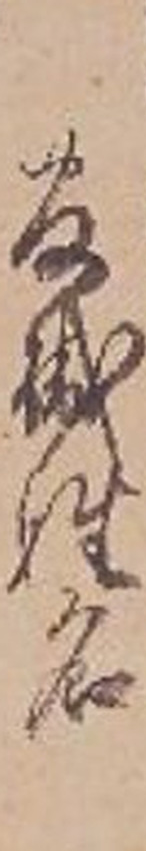官職姓名
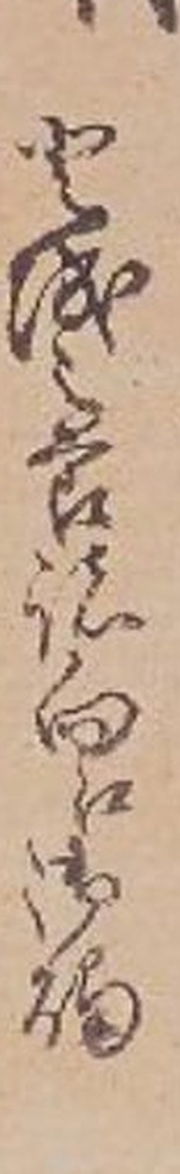同登城之節諸向江御触
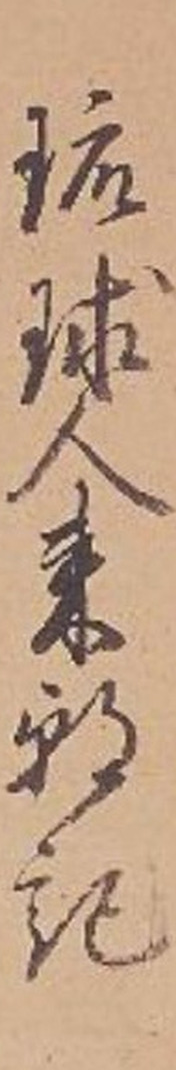琉球人来朝記
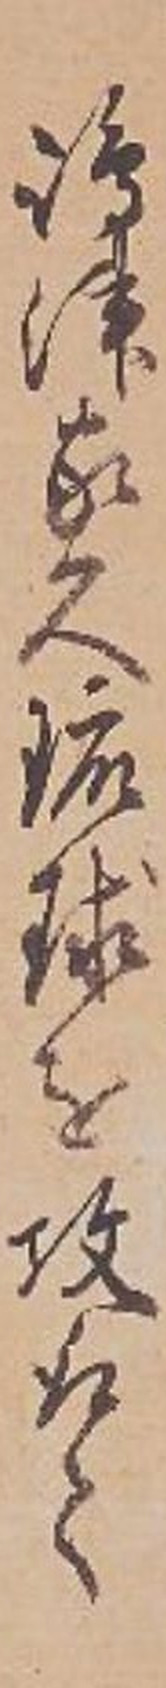嶋津家久琉球を攻取て
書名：琉球人来朝記 一、二
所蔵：University of the Ryukyus Library
